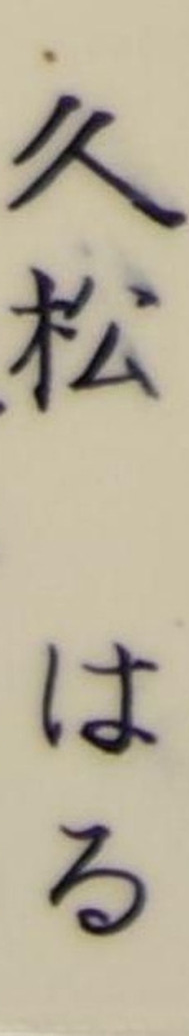久松はる
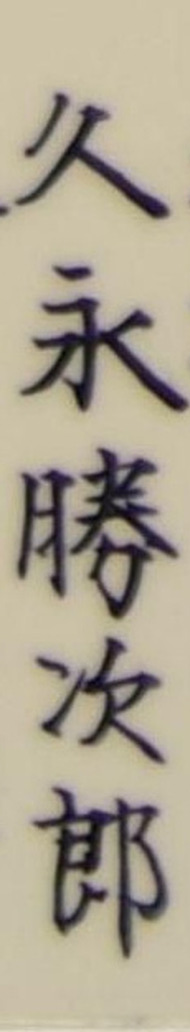久永勝次郎
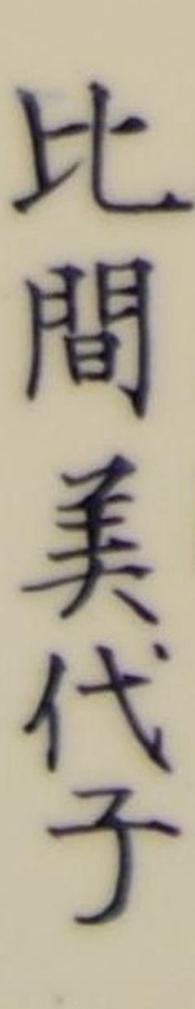比間美代子
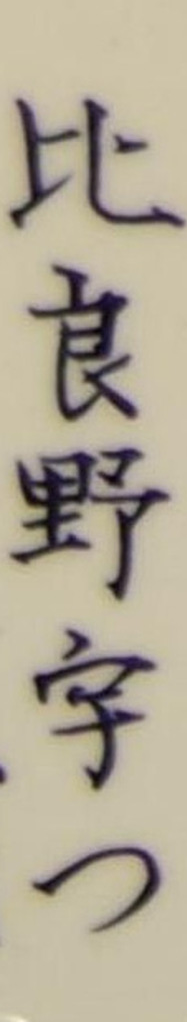比良野字つ
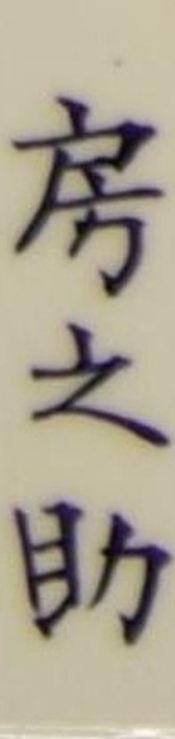房之助
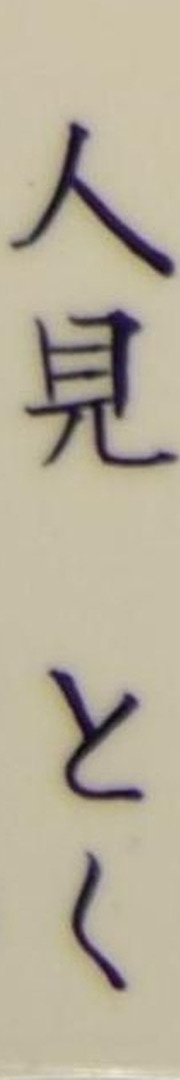人見とく

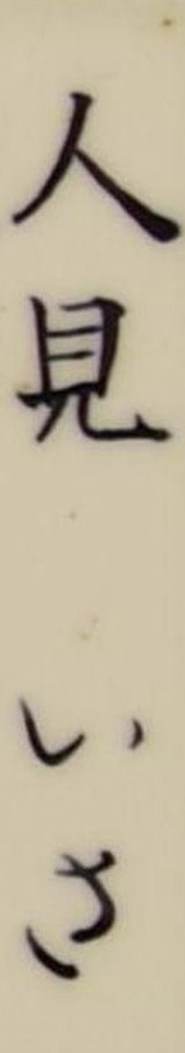人見いさ
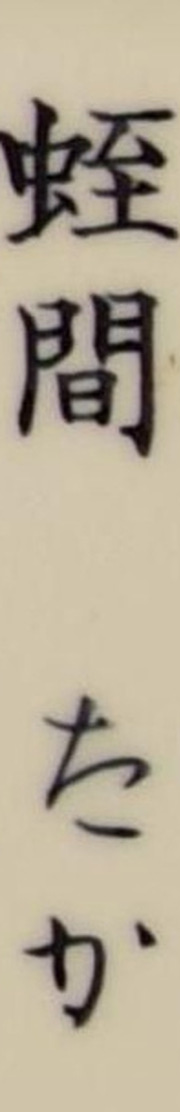蛭間たか
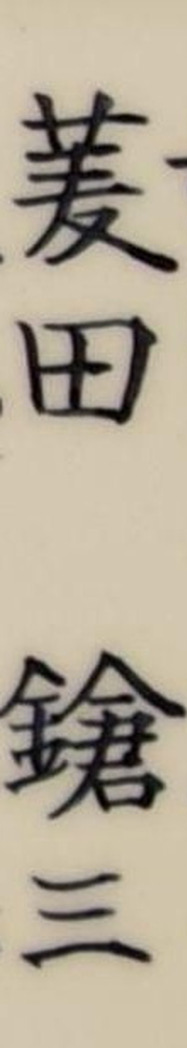菱田鎗三
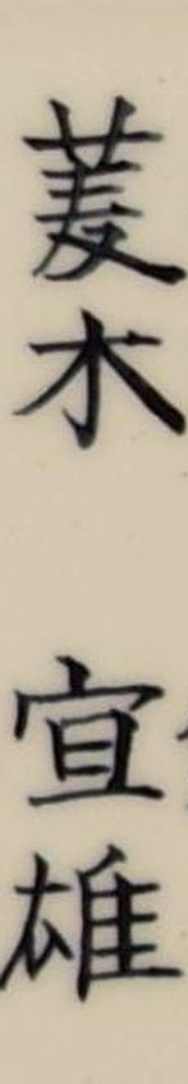菱木宜雄
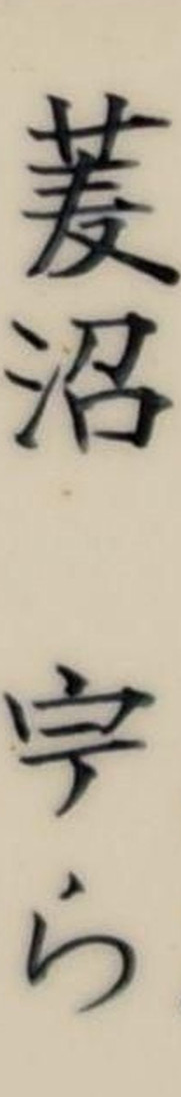菱沼うら
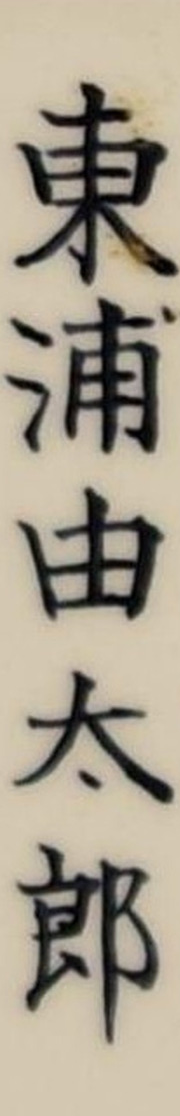東浦由太郎
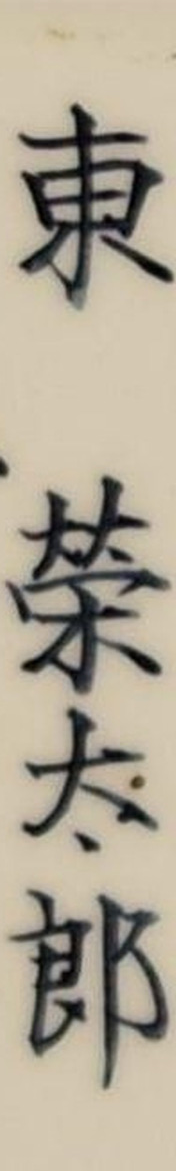東榮太郎
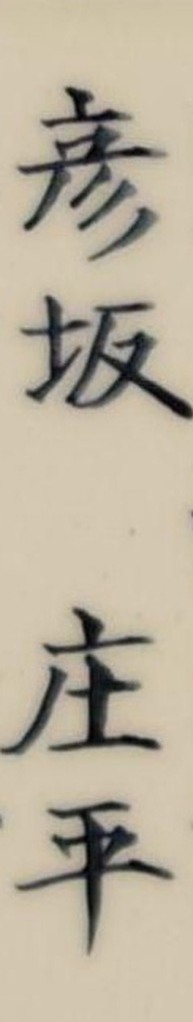彦坂庄平
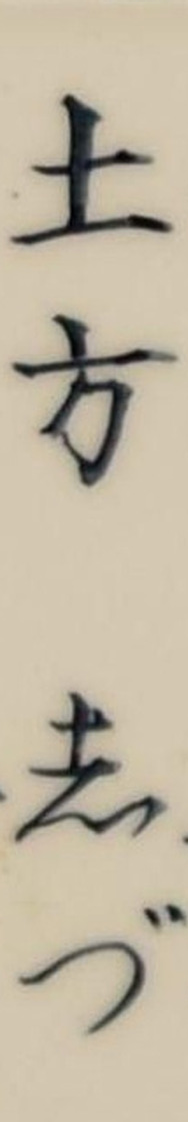土方しづ
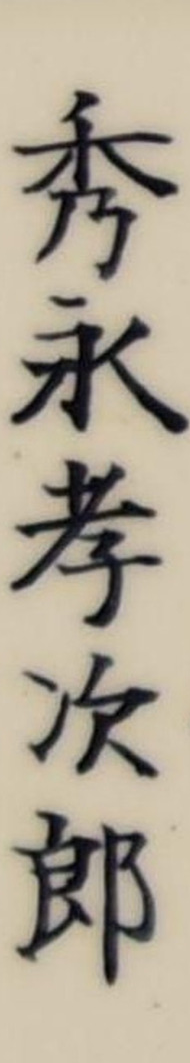秀永孝次郎
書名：A~D
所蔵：koyasan kongobuji
